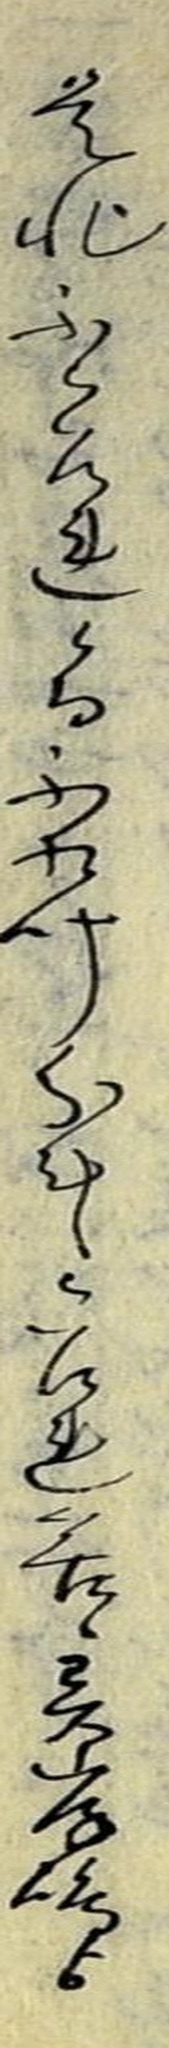是非不被召連候而不相叶分斗被召連筈候霊岸嶋ゟ
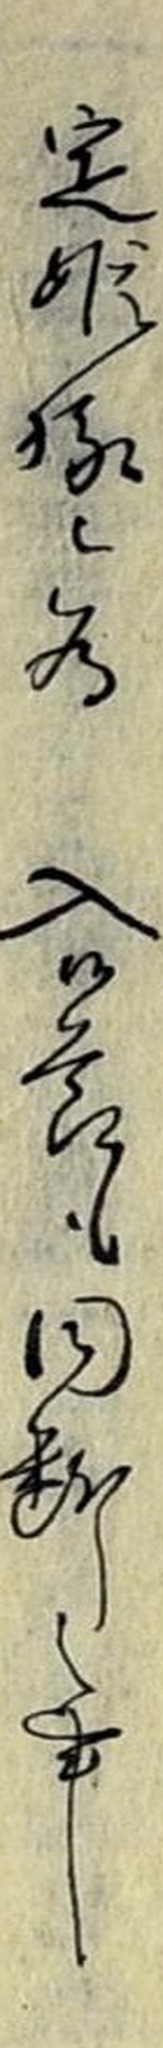定姫様被為入候節も同断之事
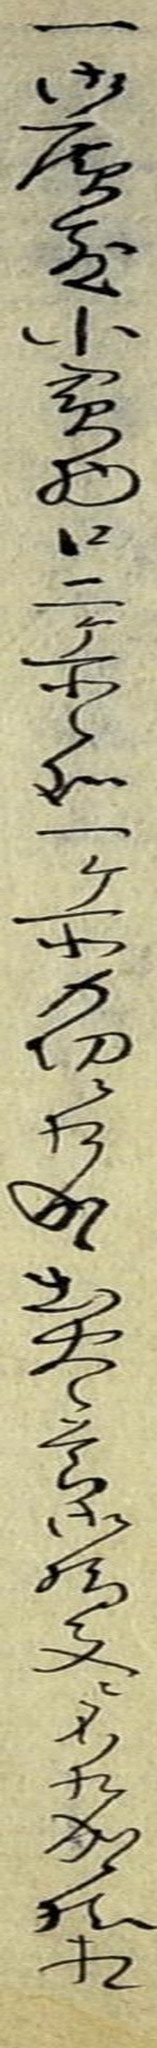一御広敷小買物口二ケ所之処一ケ所〆切に相成候出火之節御指支に不相成候様相
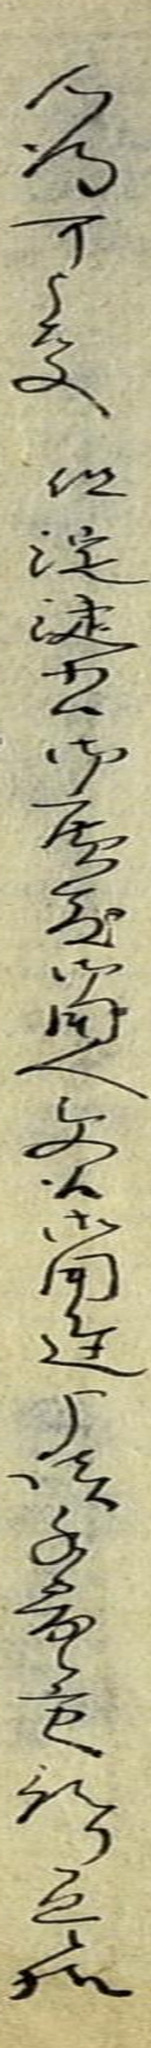心得可申事但錠鍵等は御広敷御用人受取御用達申談年寄之方へ預り置候様
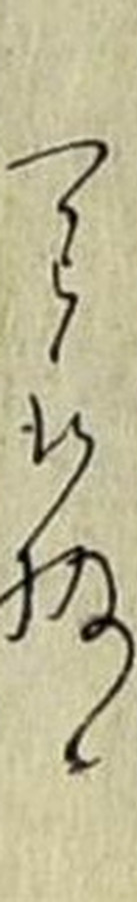可被取扱候
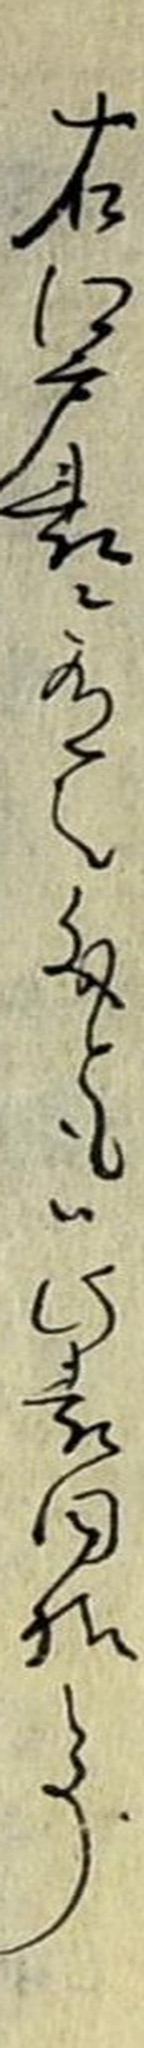右江戸表に有之義ともは此表同様之事
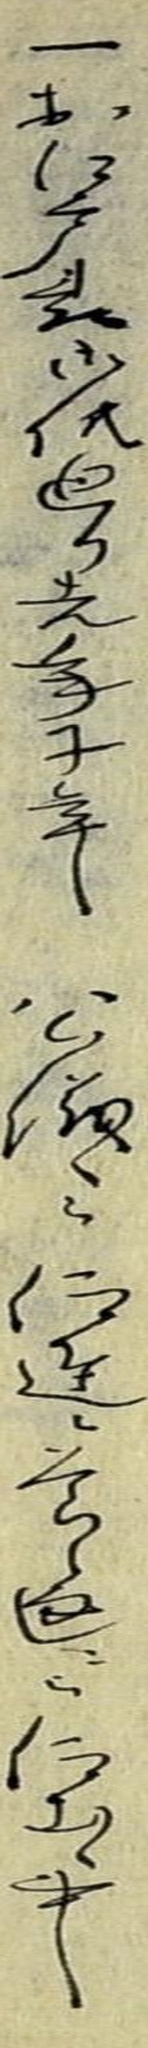一於江戸表御供廻り先年刁年公儀へ被仰達候節之通に被仰出候事
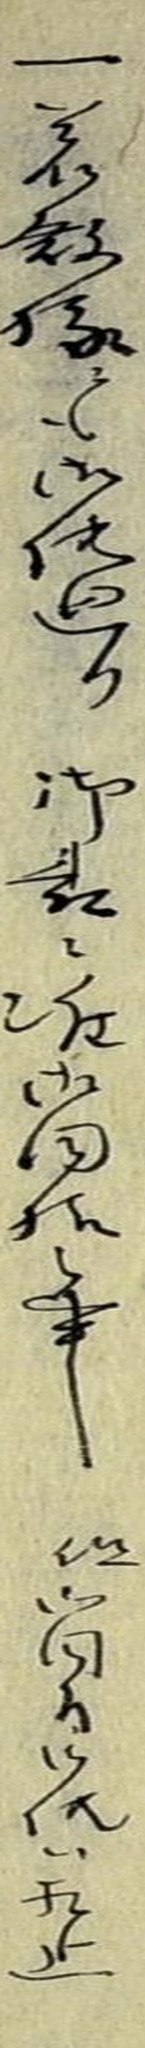一若殿様にも御供廻り御表に准御同様之事但御目付御供は相止
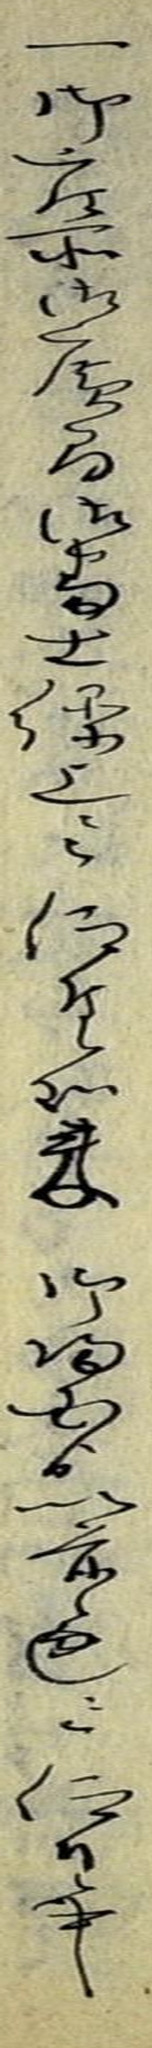一御座所御広間御番士繰上に被仰付候処来御帰国ゟ以前之通に被仰付候事
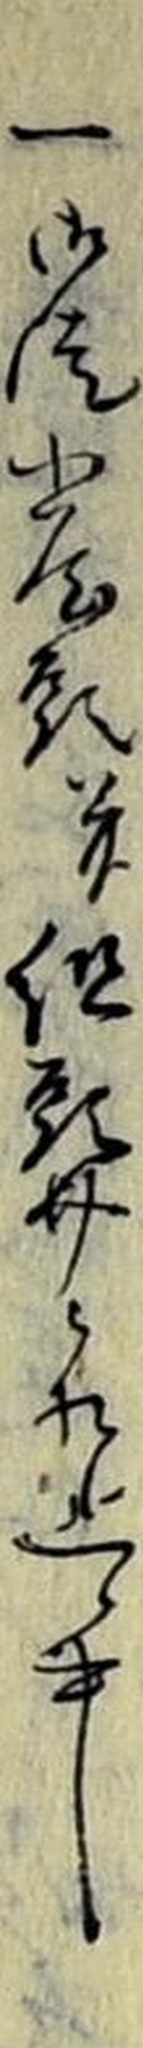一御徒小屋頭并組頭介被相止候事
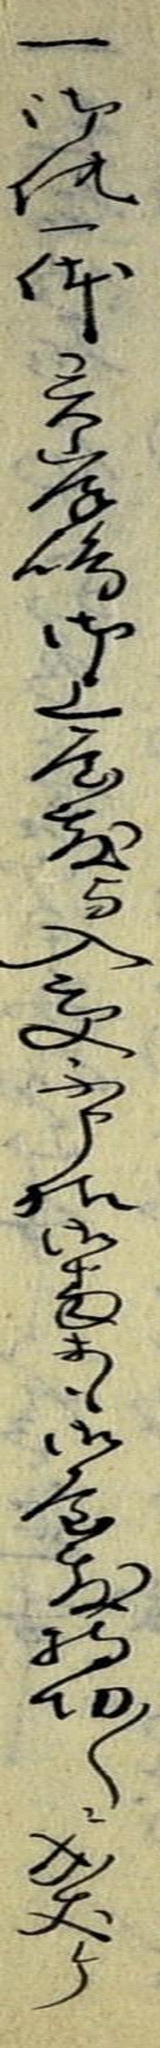一御供一体霊岸嶋御上屋敷与入交不申様御番等も御屋敷も持切〳〵に成丈ケ
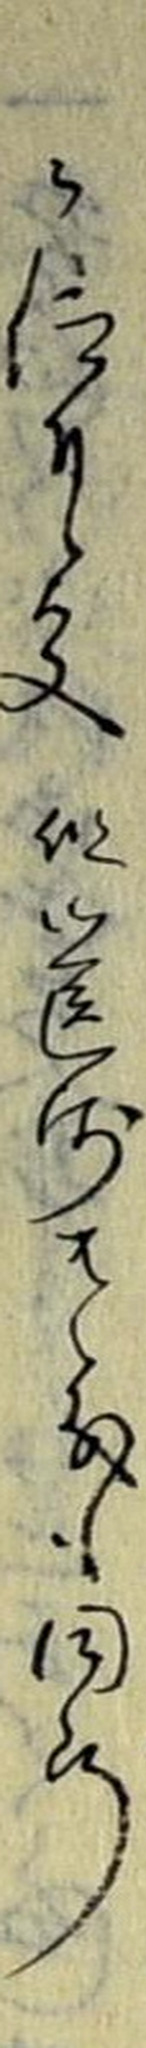被仰付候事但御医師共之義も同断
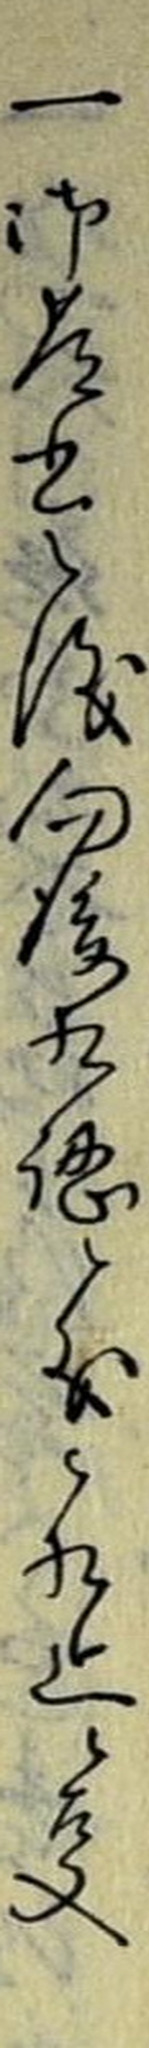一御道書之儀向後相認候義被相止候事
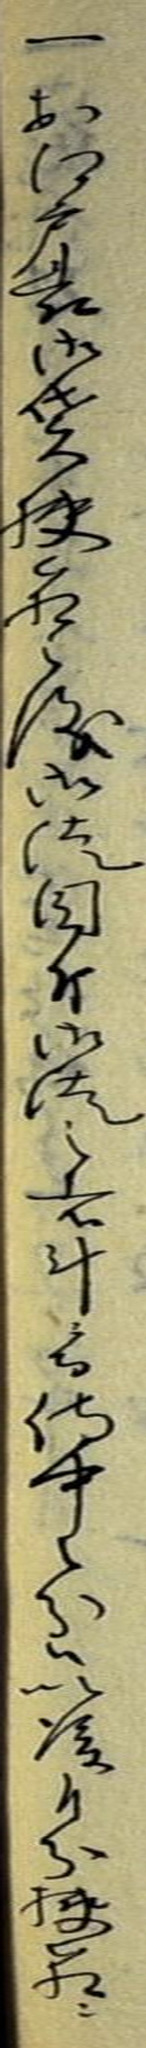一於江戸表御貸挟箱之儀御徒目付御徒之者斗に而侍中之分は以後自分挟箱に
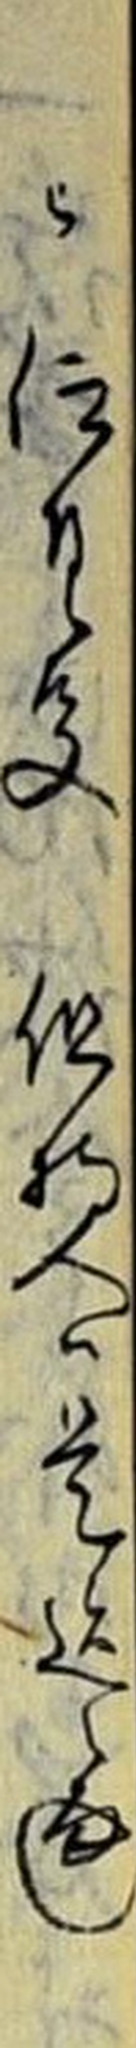被仰付候事但持人は是迄之通
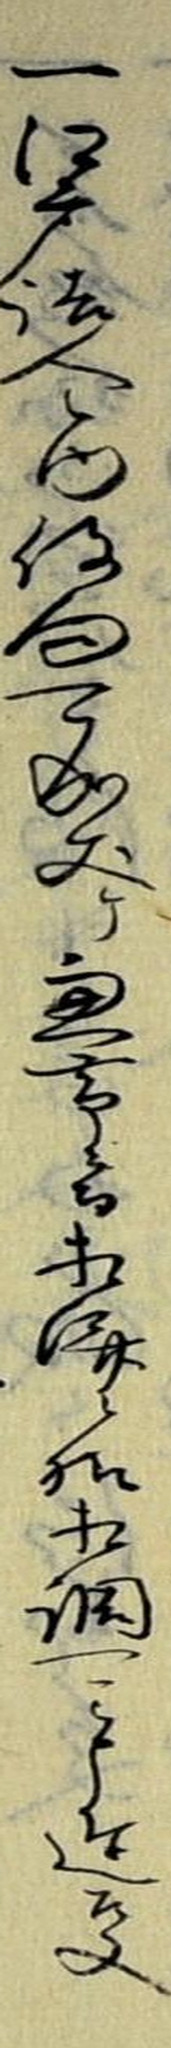一江戸詰人之内役向可成丈ケ兼帯に而相済候様相調可被申達事
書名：命令之部 二
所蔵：福井県文書館 Fukui Prefectural Archives
